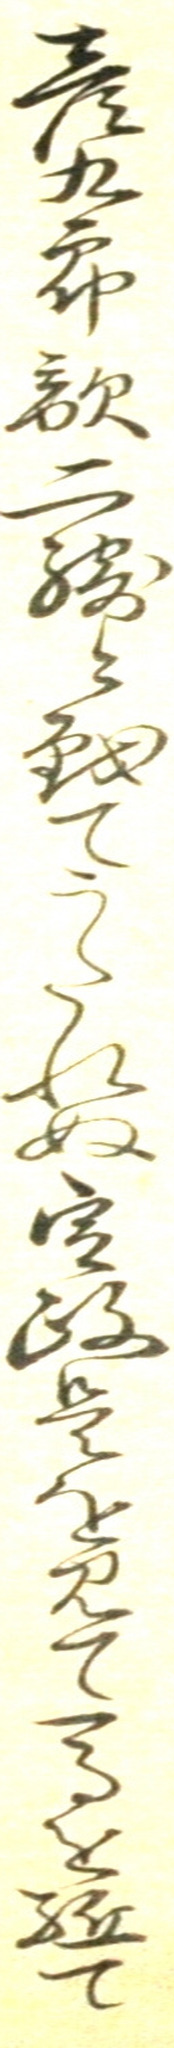彦九郎敵二騎と戦てうたれぬ定政是を見て馬を駈て
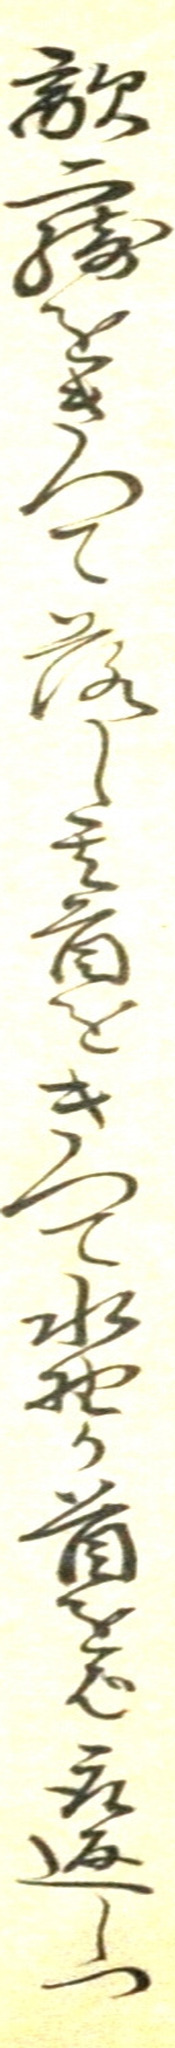敵二騎をきつて落し其首をきつて水野か首をば取返しつ
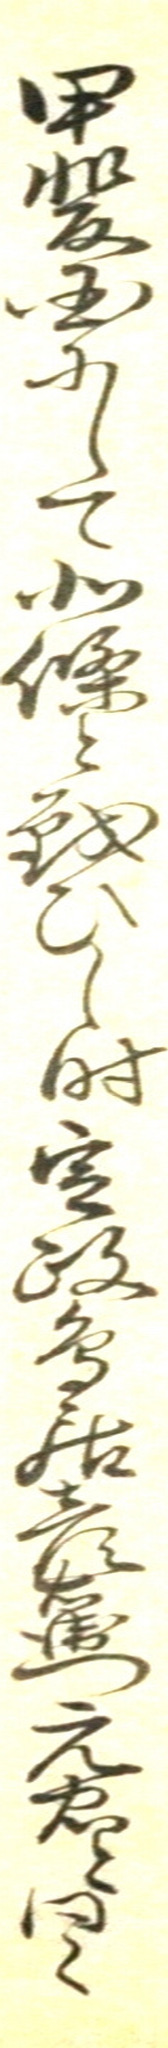甲斐国にして北条と戦ひし時定政鳥居彦右衛門元忠と同く
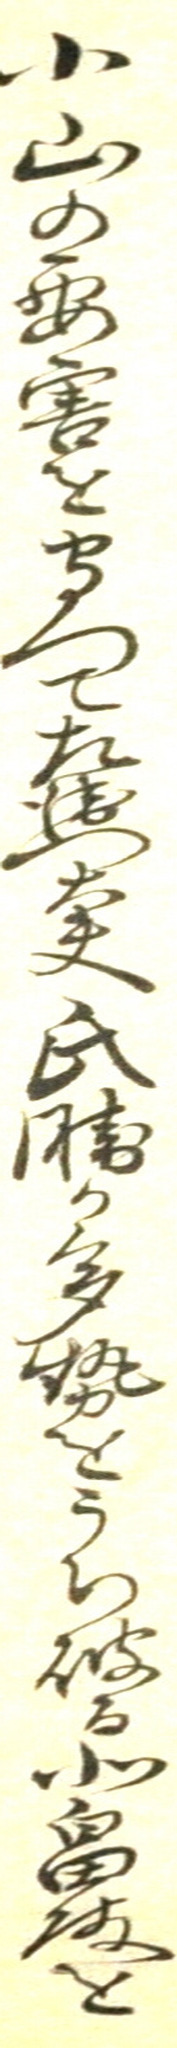小山の要害を守つて左衛門大夫氏勝か多勢をうち破る北畠殿を
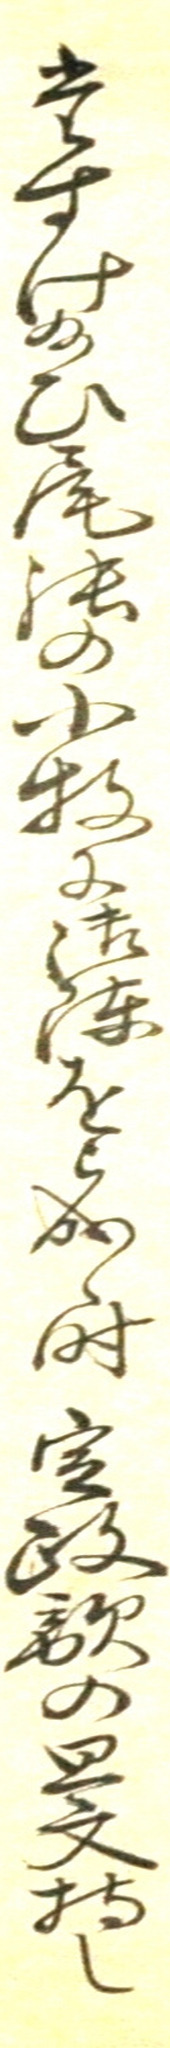たすけ給ひ尾張の小牧に御陣をと成し時定政敵の廻文持し
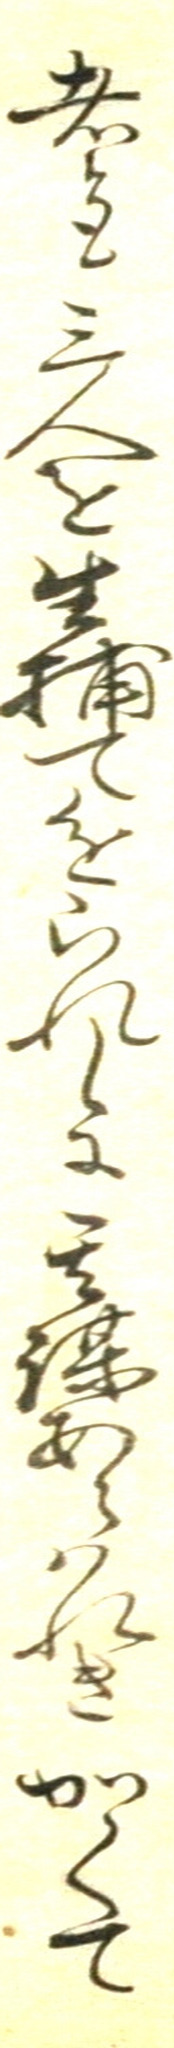者とも三人を生捕て進られしに其謀あらわれきかくて
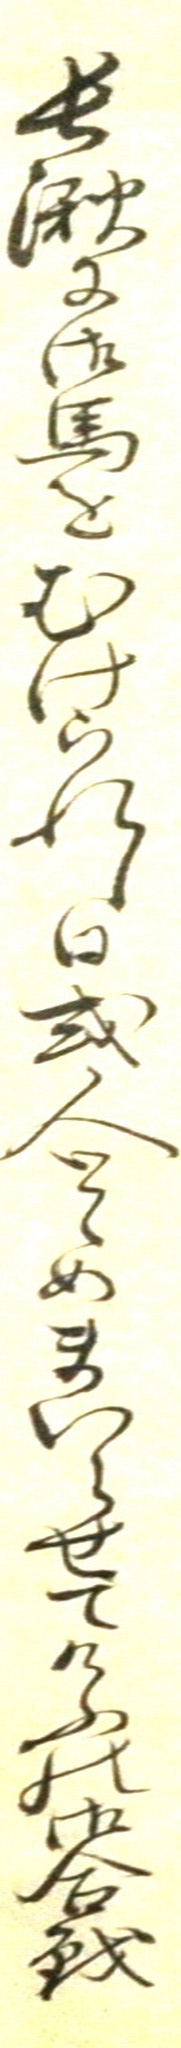長湫に御馬をむけられし日或人とゝめまいらせてけふの御合戦
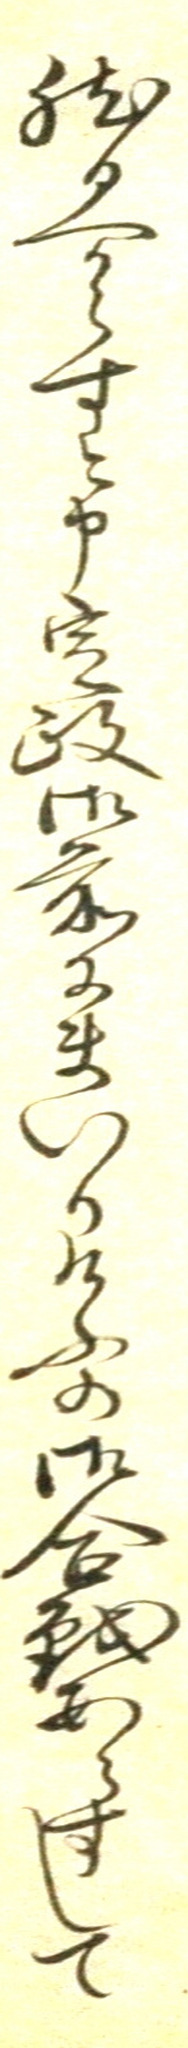然るへからすと申定政御前にまいりけふの御合戦あらすして
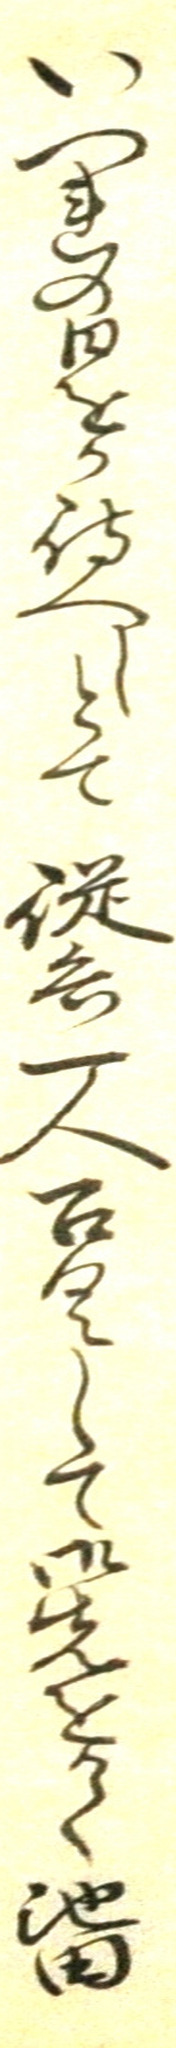いつれの日をか待へしとて従兵一人召具して御先をかく池田
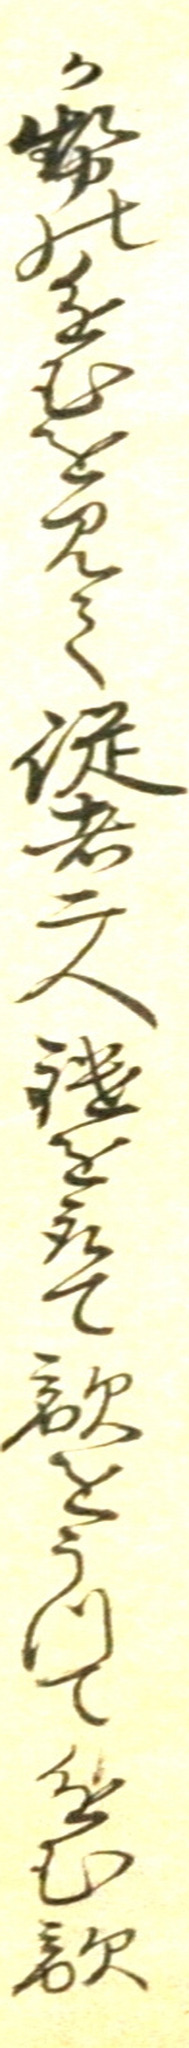か勢の進むを見て従者二人鑓を取て敵をうつて進む敵
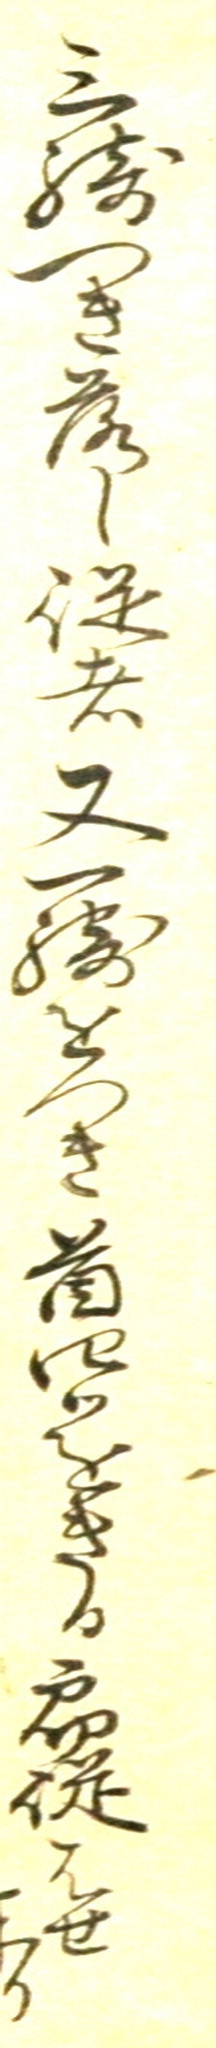三騎つき落し従者又一騎をつき首四ッをきる郎従はせ来り

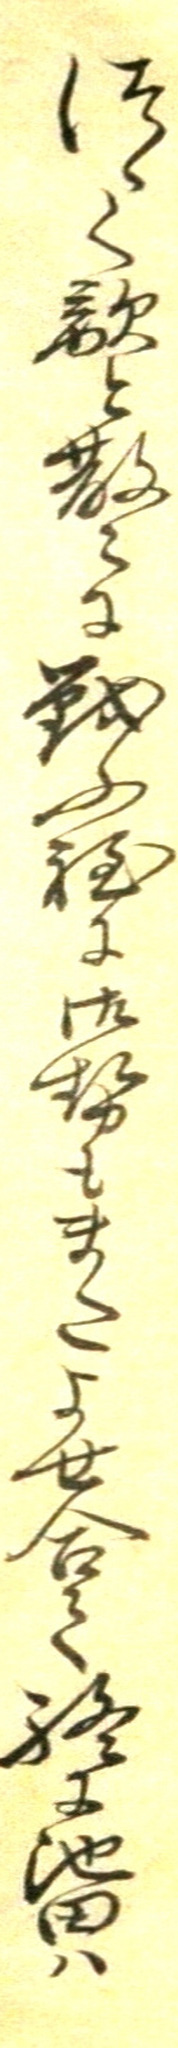つゝく敵と散々に戦ふ程に御勢もまたよせ合て終に池田は
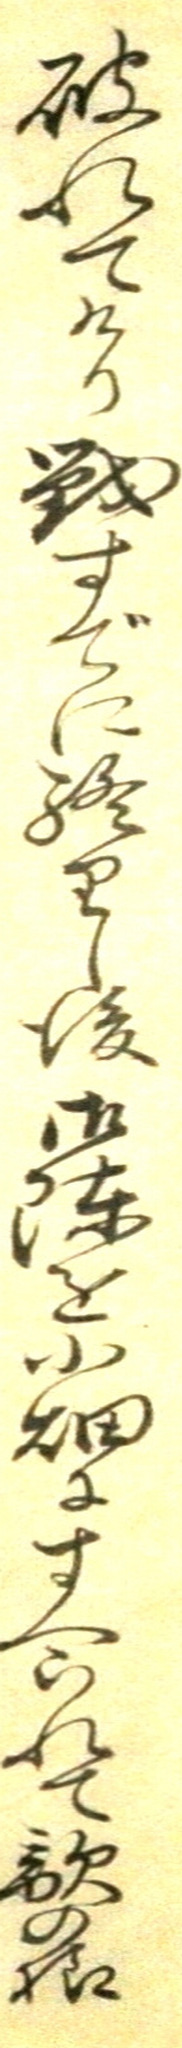破れてけり戦すでに終りし後御陣を小畑にすへられて敵の様
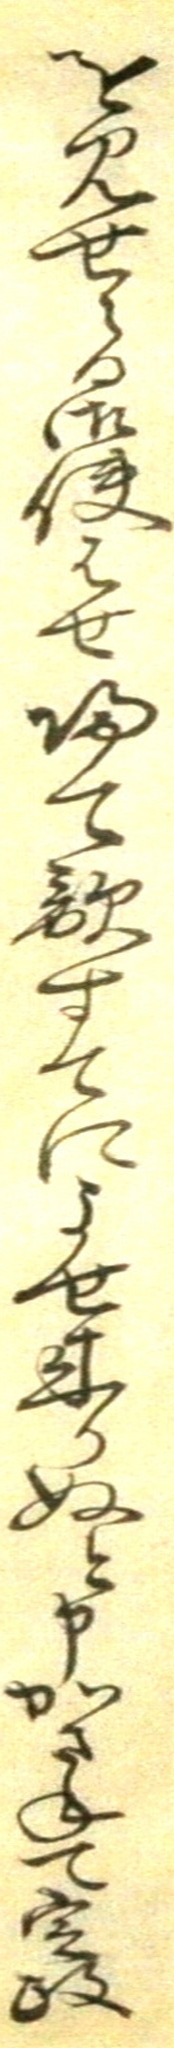を見せらる御使はせ帰て敵すてによせ来りぬと申かさねて定政
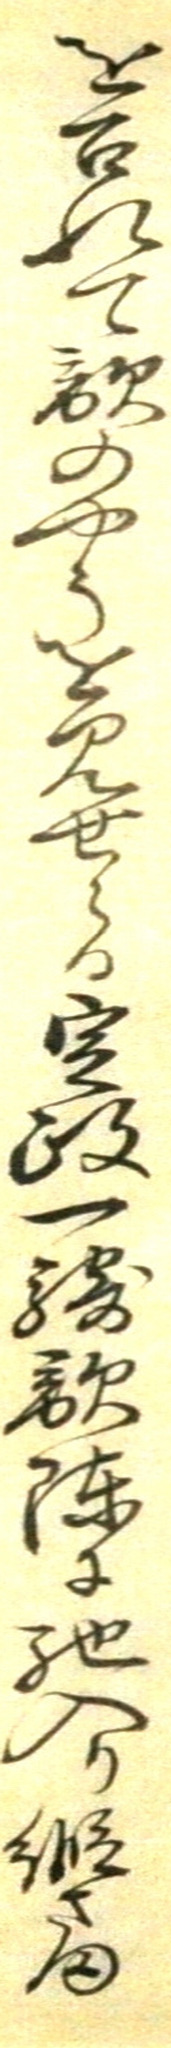を召れて敵のやうを見せらる定政一騎敵陣に馳入り縦さま
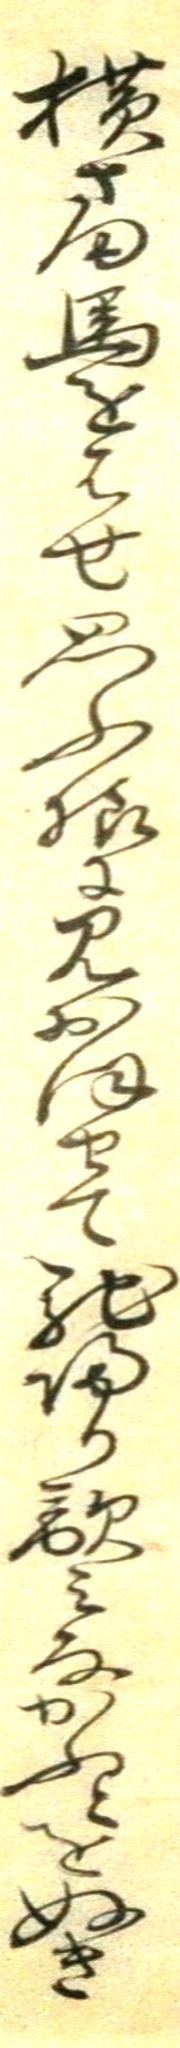横さま馬をはせ思ふ様に見おほせて馳帰り敵みなかふとをぬき
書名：藩翰譜（四・下）
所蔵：伊那市立高遠町図書館・合同会社AMANE
